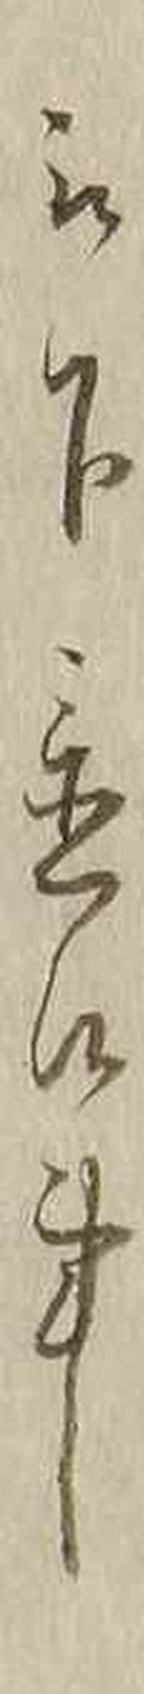被下置候事
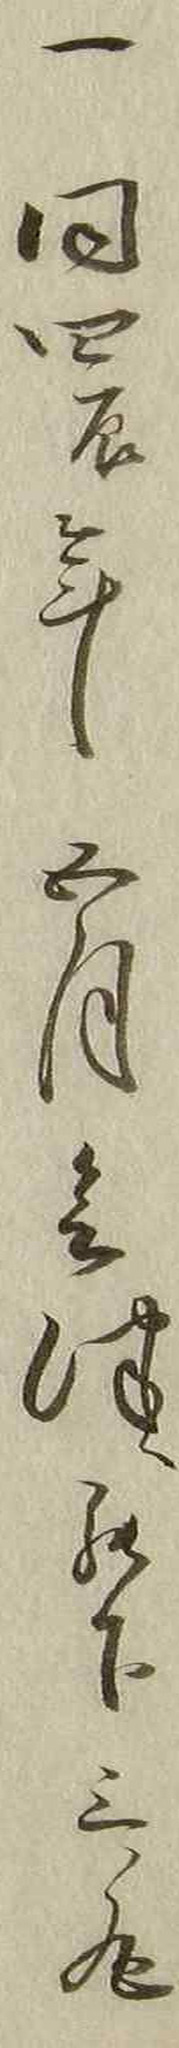一同四辰年五月会津へ罷下三ノ丸
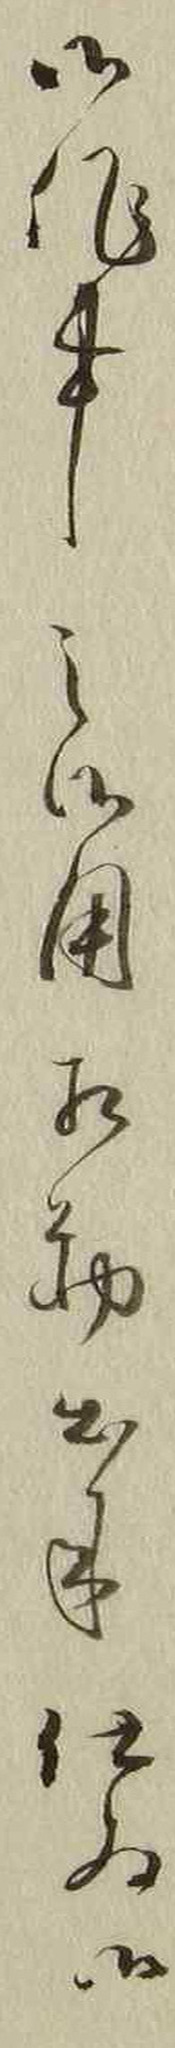御作事之御用相勤出来仕為御
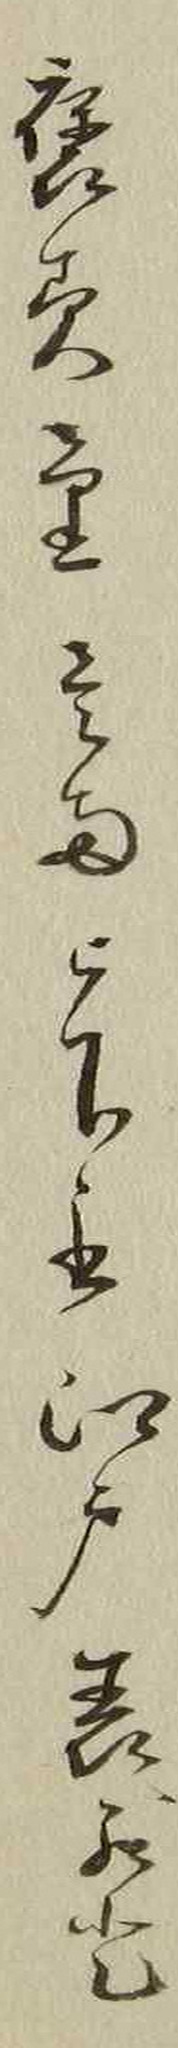褒美金壱両被下置江戸表へ罷登
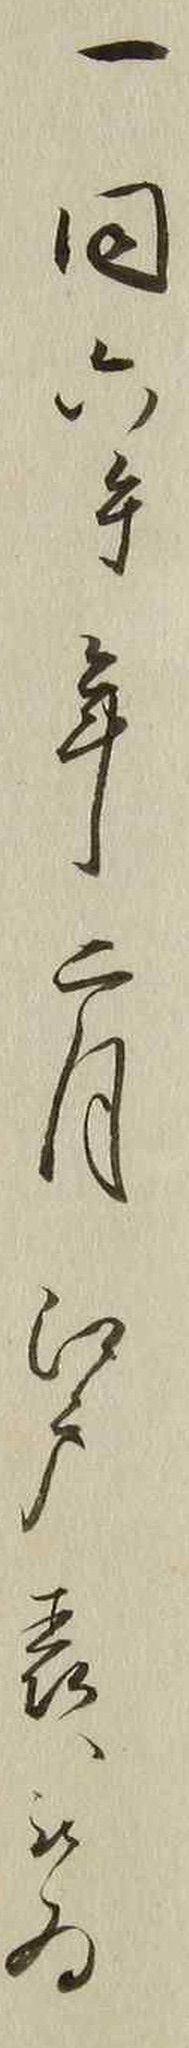一同六午年二月江戸表へ被為
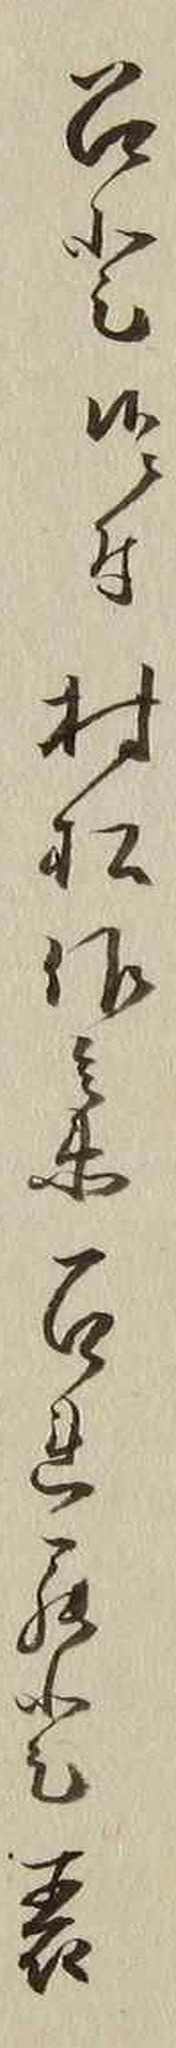召登候ニ付村松作兵衛召連罷登表
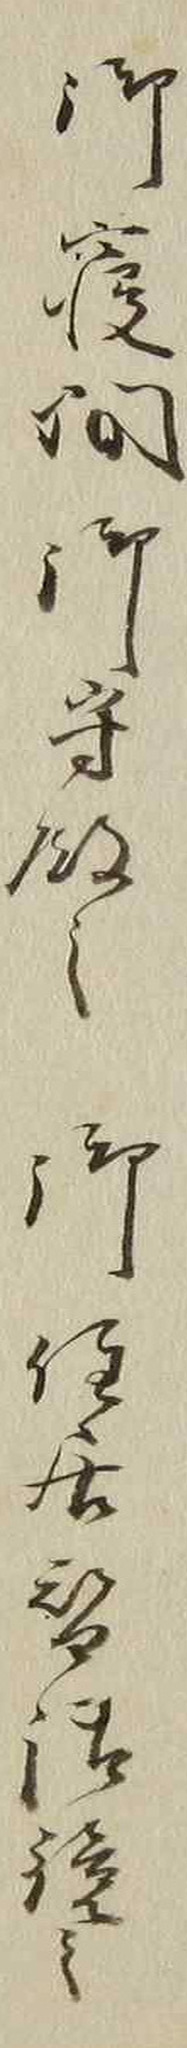御寝間御守殿之御住居替御鏡之
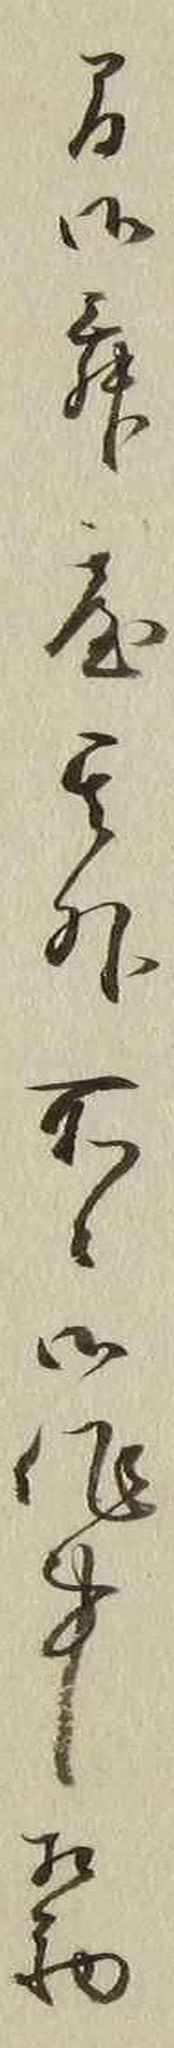間御舞台其外所々御作事相勤
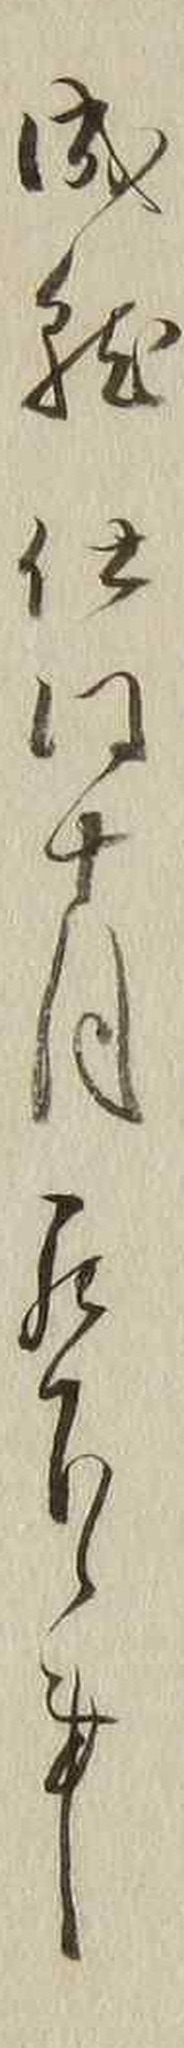成就仕同十月罷下候事
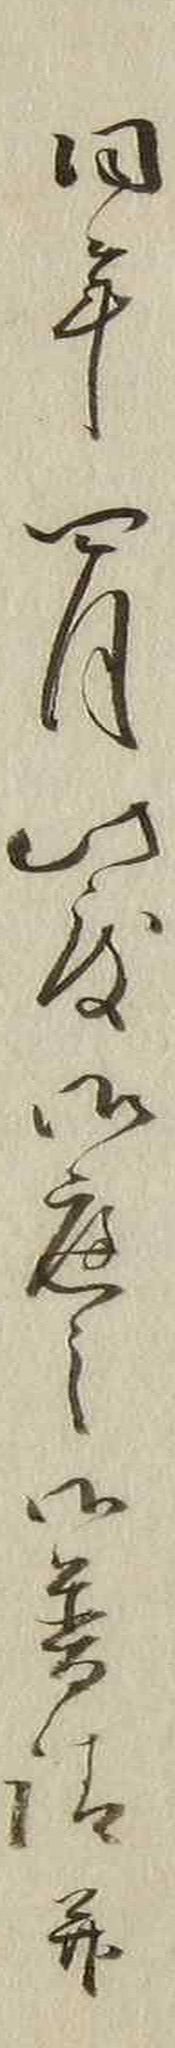一同年四月此度御庭之御普請并
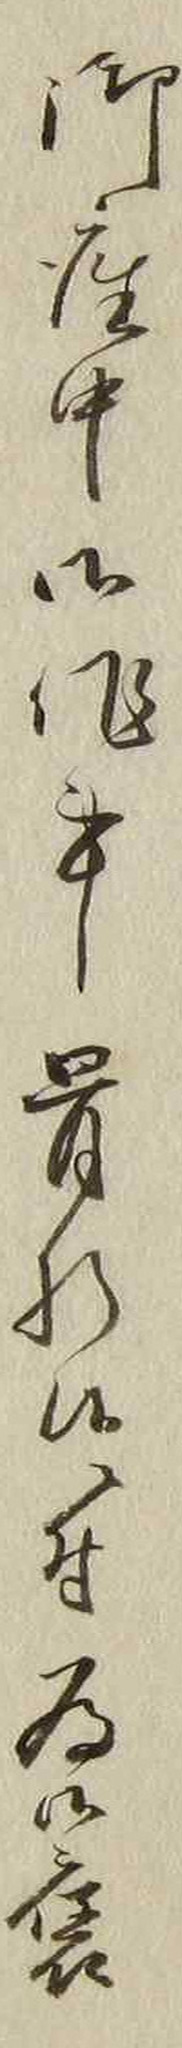御座中御作事骨折候ニ付為御褒
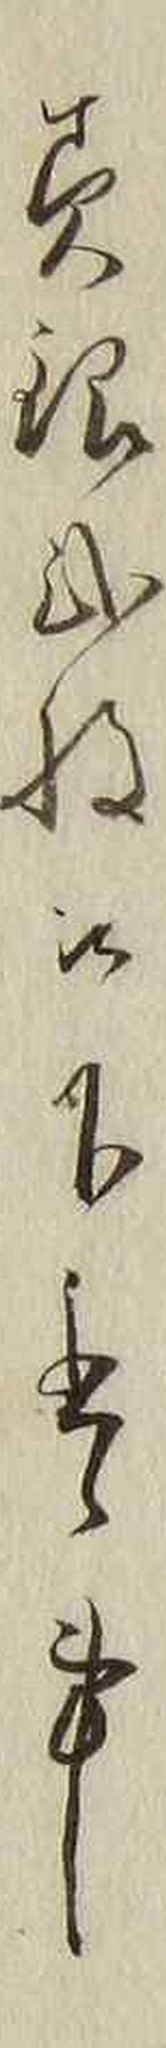美銀弐枚被下置候事
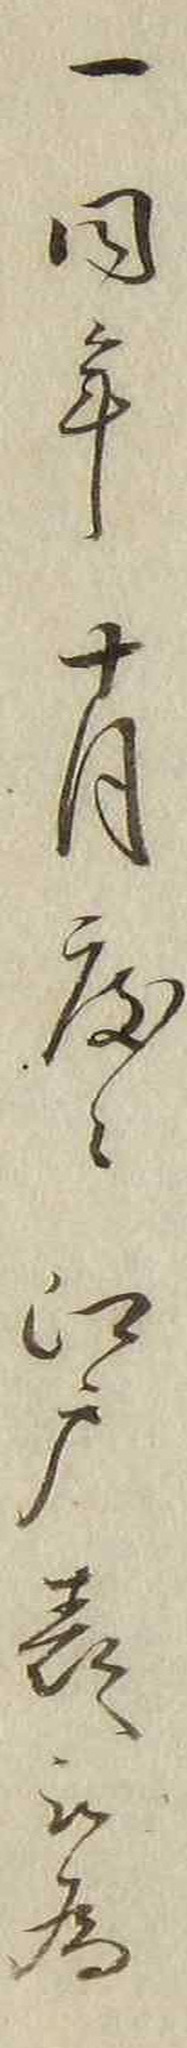一同年十月度々江戸表へ被為
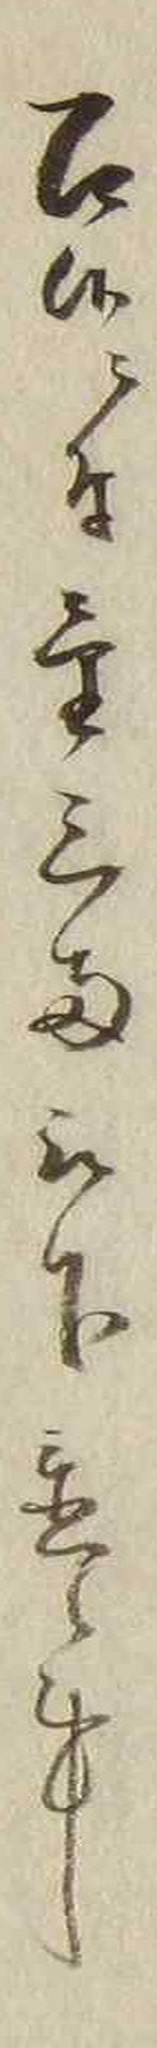召候ニ付金三両被下置候事

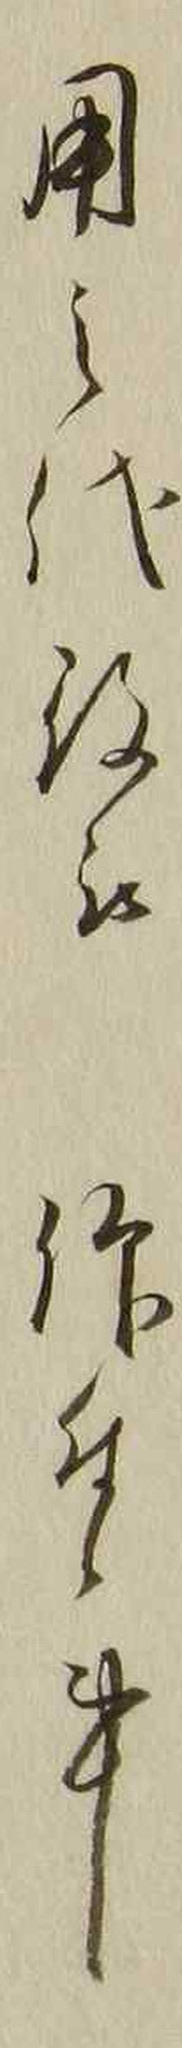用之代役被仰付候事
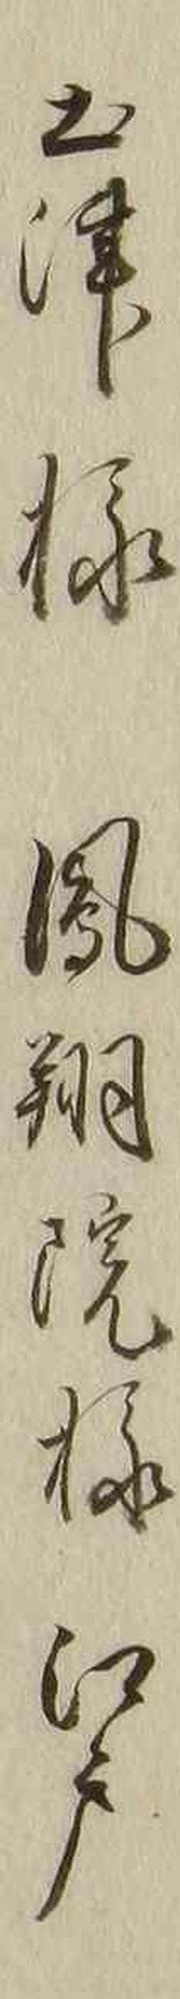土津様鳳翔院様江戸
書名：諸士系譜　巻之28　い之部28
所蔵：会津若松市立会津図書館
